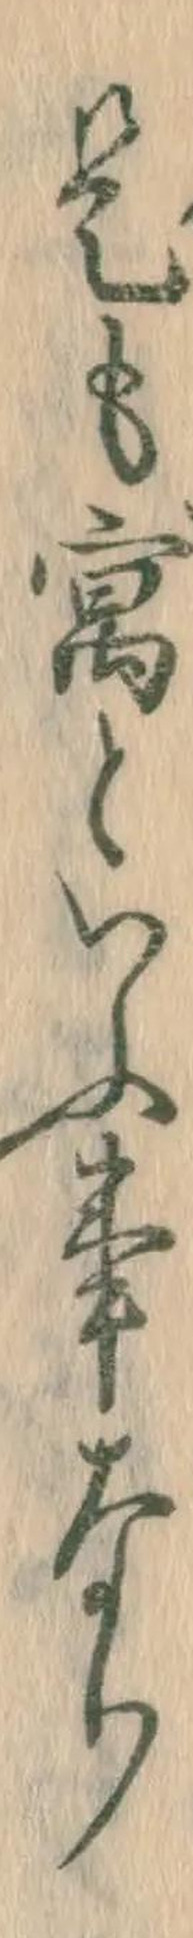是も寓といふ事なり
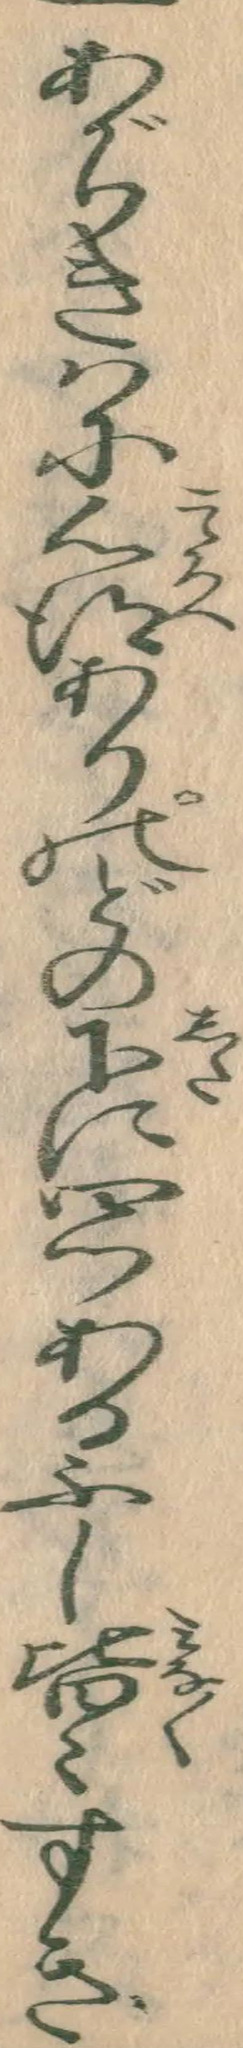一あがりきはに心得あり。のどの下に四つあるふし皆々すき
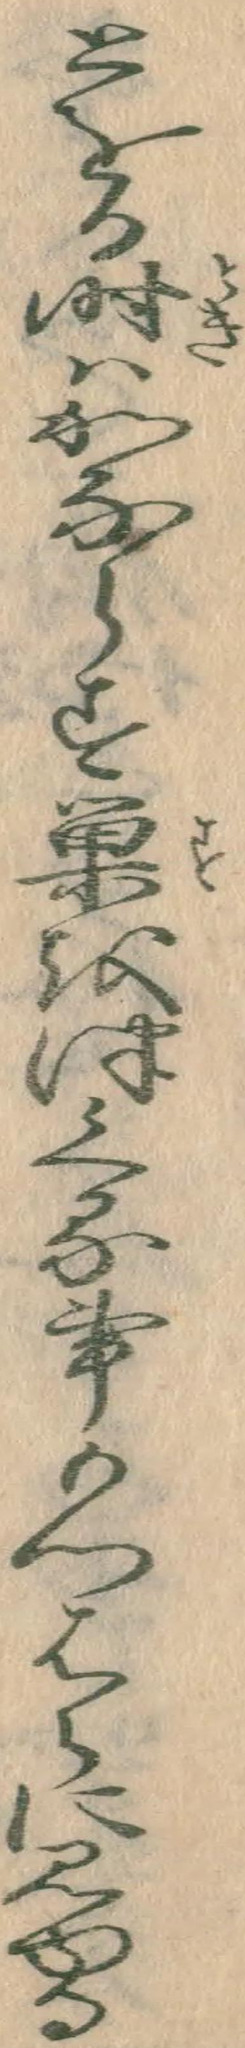とをる時はかならす巣をつくる事もつはらに見ゆる
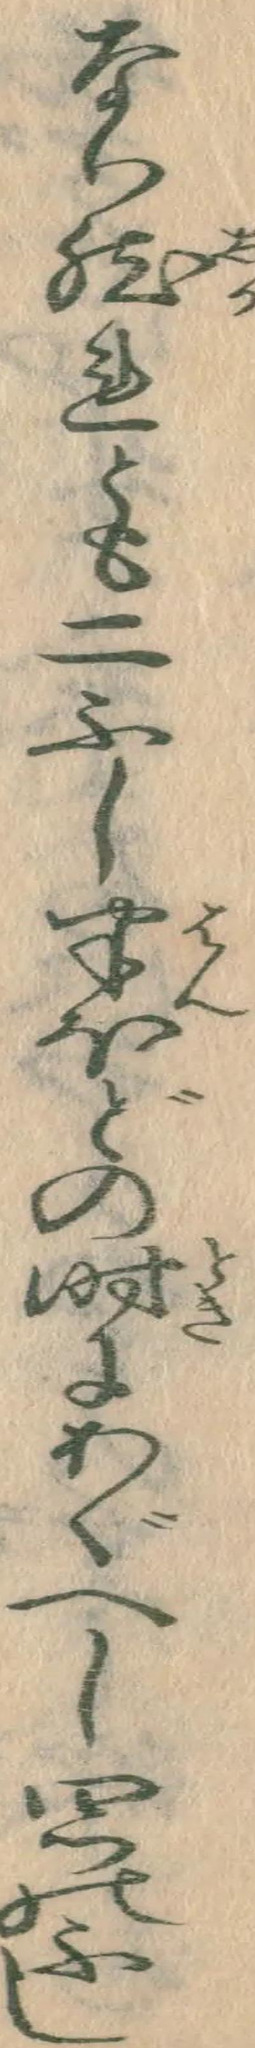なり然れとも二ふし半ほどの時にあぐへし四つのふし
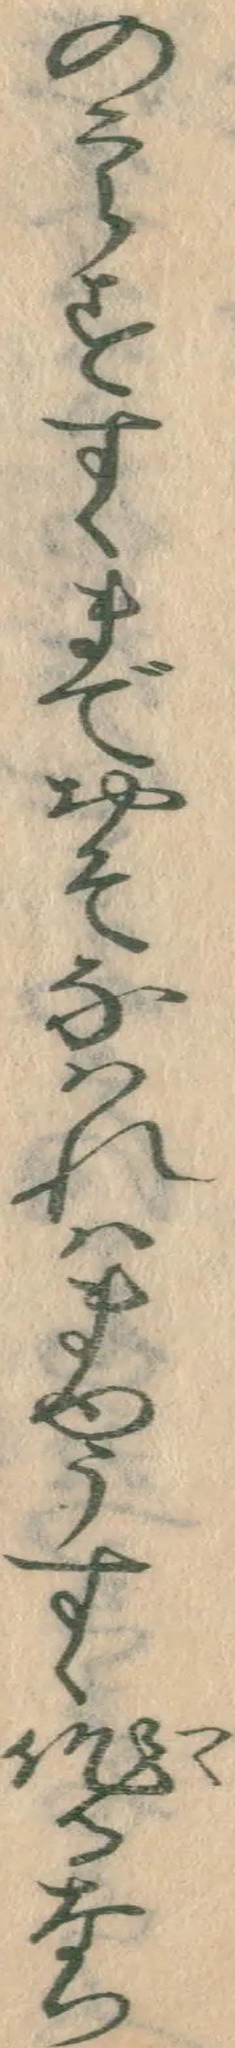のこらすくまでおそなはれはまゆうすく作るなり
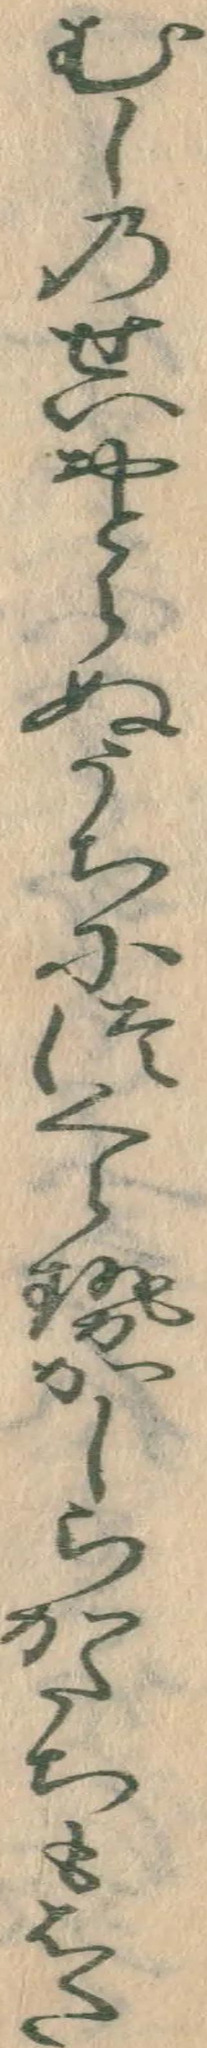むしのせいおとらぬうちにつくらせかしらかたちもはた
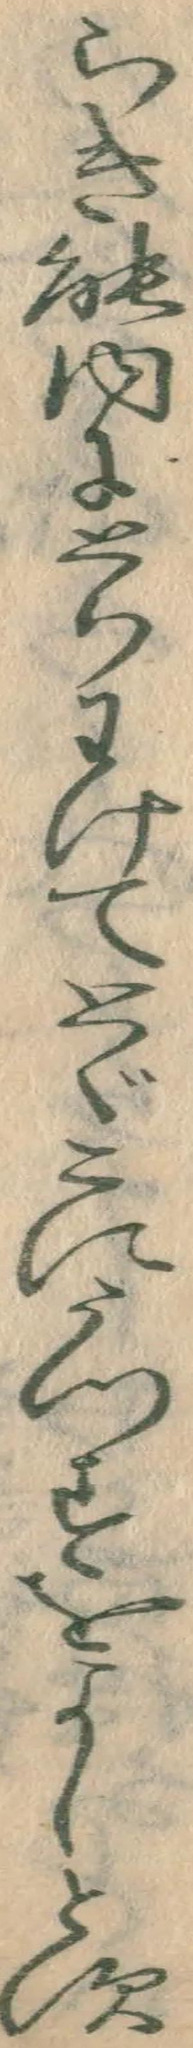らき能内にとりわけてとゞこにうつすをよしとす
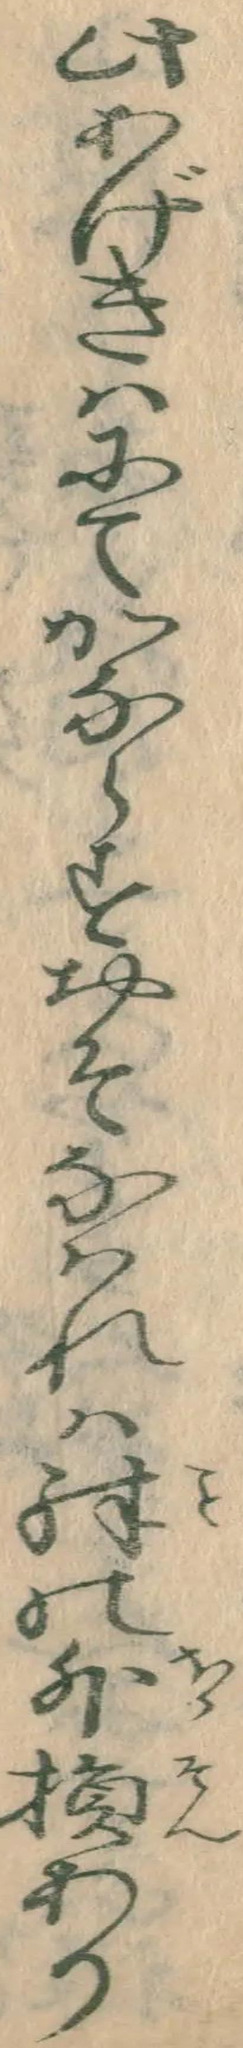此あげきはにてかならすおそなはれは殊の外損あり
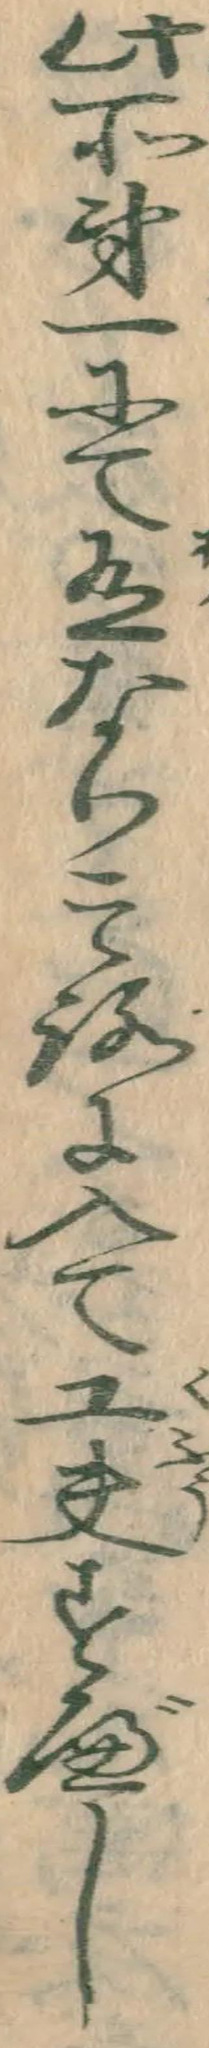此所第一にて有なりこゝろに入て工夫すべし

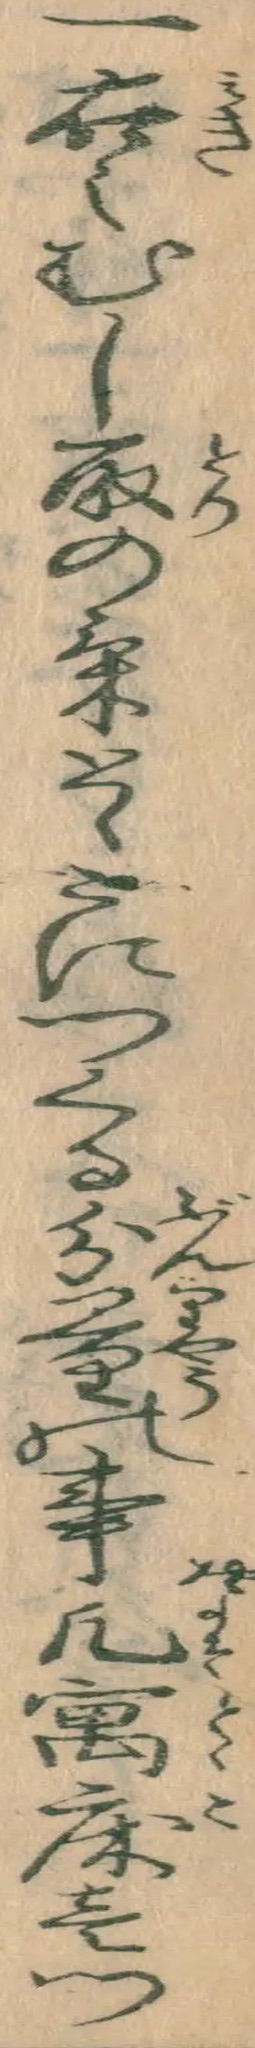一右のむし取の気とゝこにつくる分量の事凡寓床壱つ
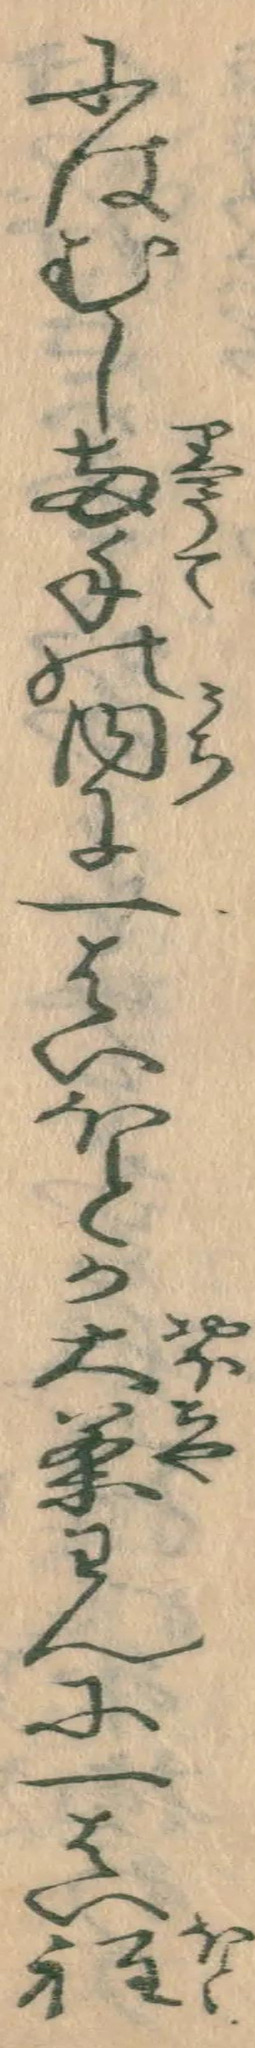にはむし両手の内に一はいほとか大茶わんに一はい程
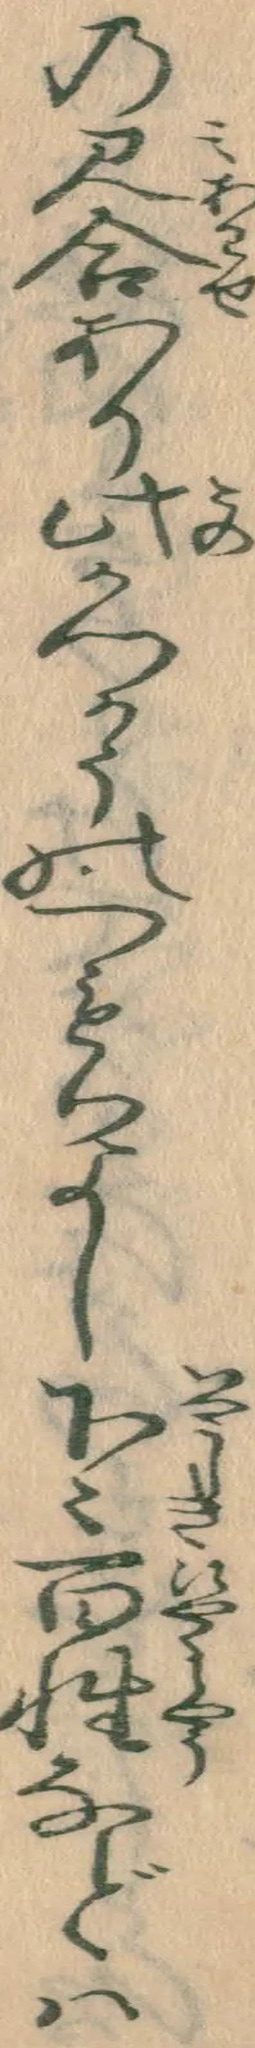の見合あり此かつかうのつもりよし下々百姓などは
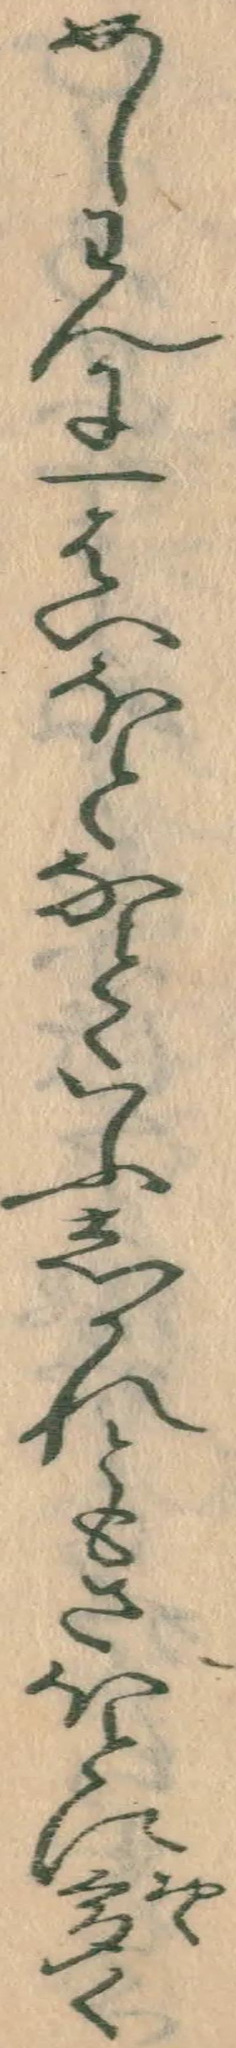めしわんに一はいほとなとゝいふしかれともさほとに多く
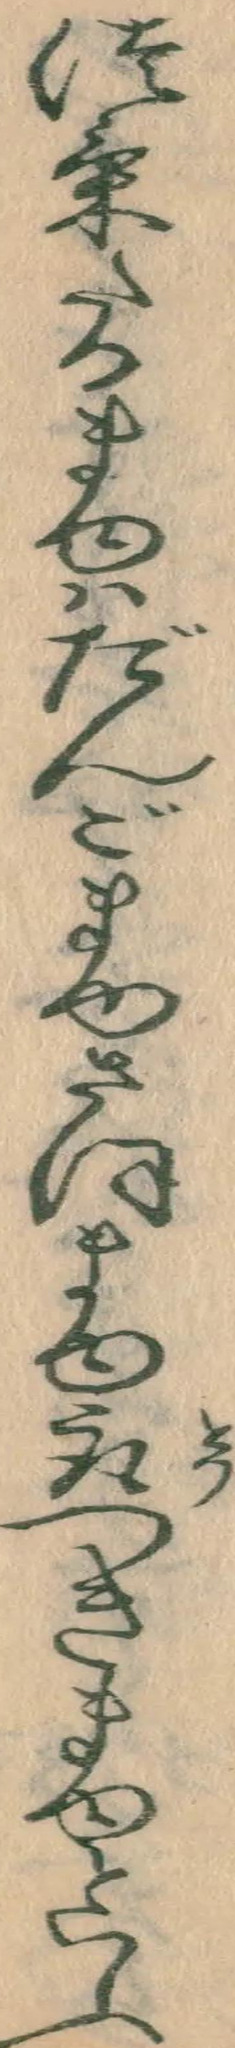つけたるまゆはだんごまゆさほまゆ取つきまゆといふ
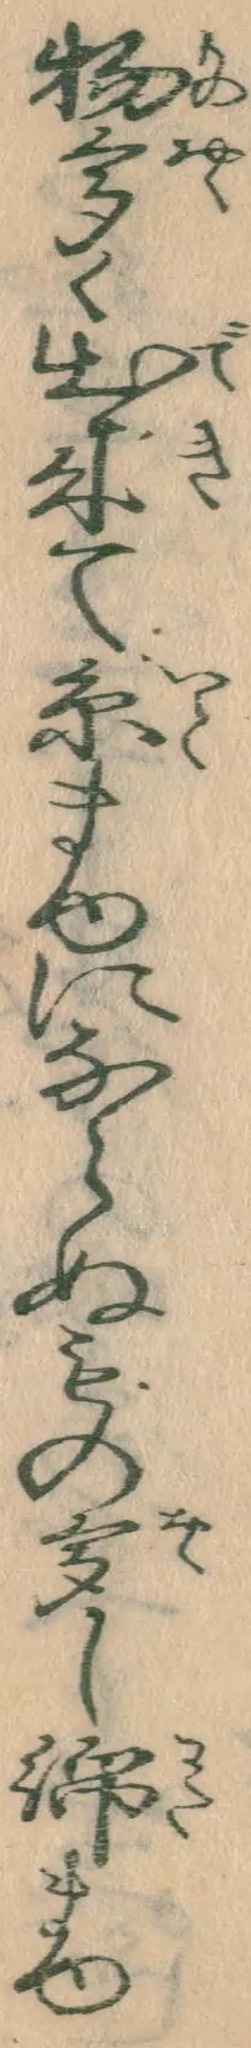物多く出来て糸まゆにならぬもの多し綿まゆ
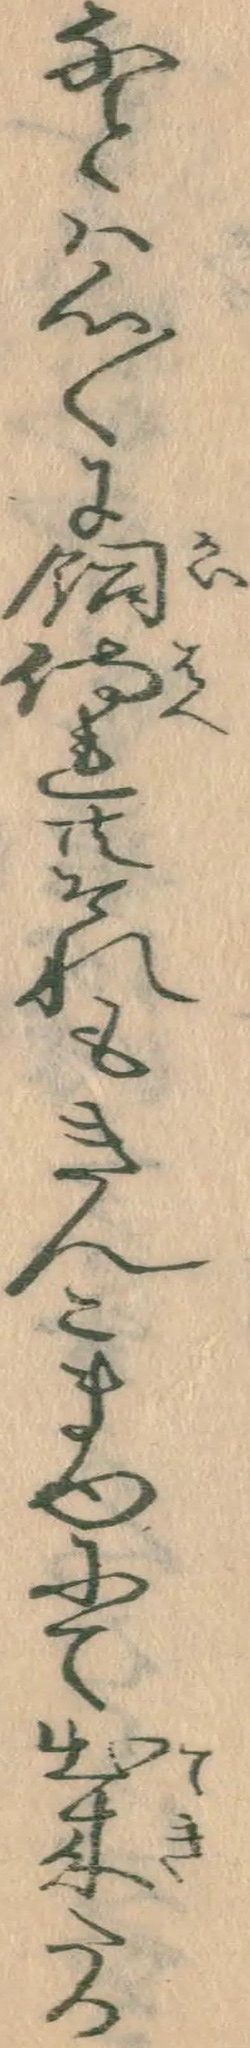なとは心〳〵に飼侍れ共それもきんこまゆにて出来たる
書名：蚕飼養法記
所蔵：国立国会図書館 National Diet Library, JAPAN
